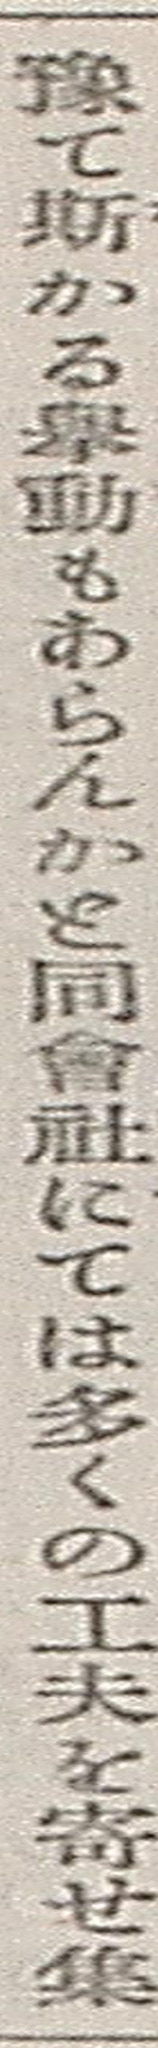予て斯かる挙動もあらんかと同会社にては多くの工夫を寄せ集
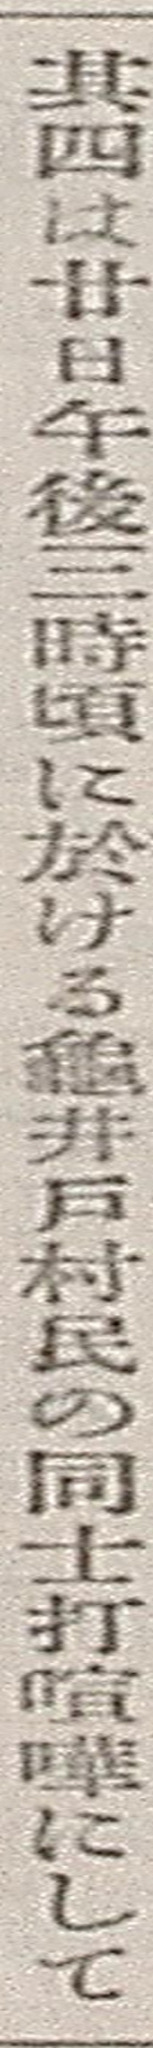其四は廿日午後三時頃に於ける亀井戸村民の同士打喧嘩にして
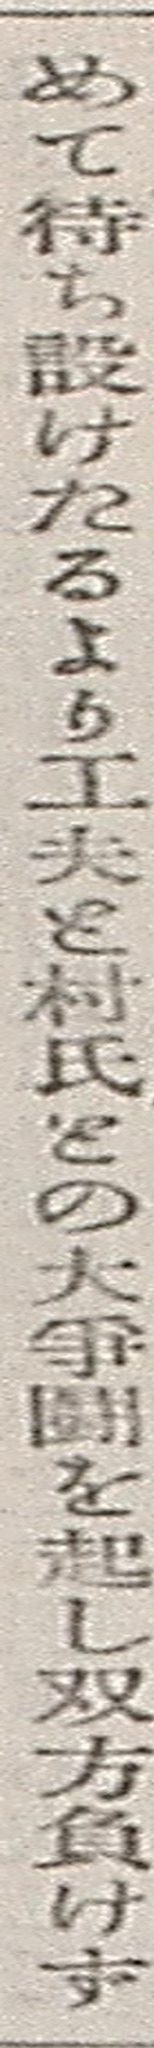めて待ち設けたるより工夫と村民との大争闘を起し双方負けず
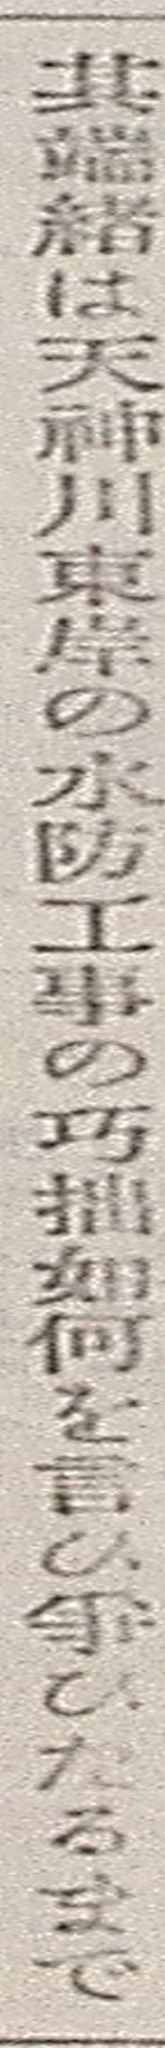其端緒は天神川東岸の水防工事の巧拙如何の言ひ争ひたるまで
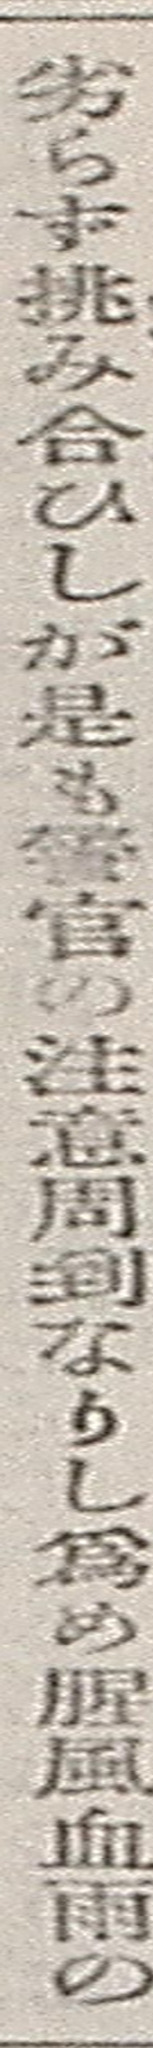劣らず挑み合ひしが是も警官の注意周到なりし為め腥風血雨の
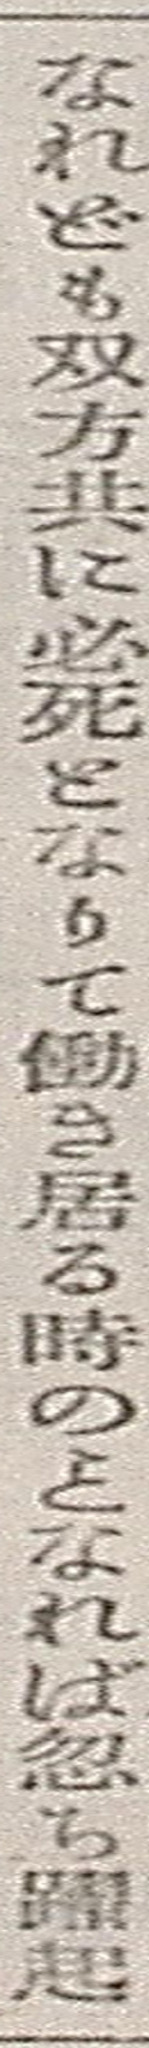なれども双方共に必死となりて働き居る時のことなれば忽ち躍起
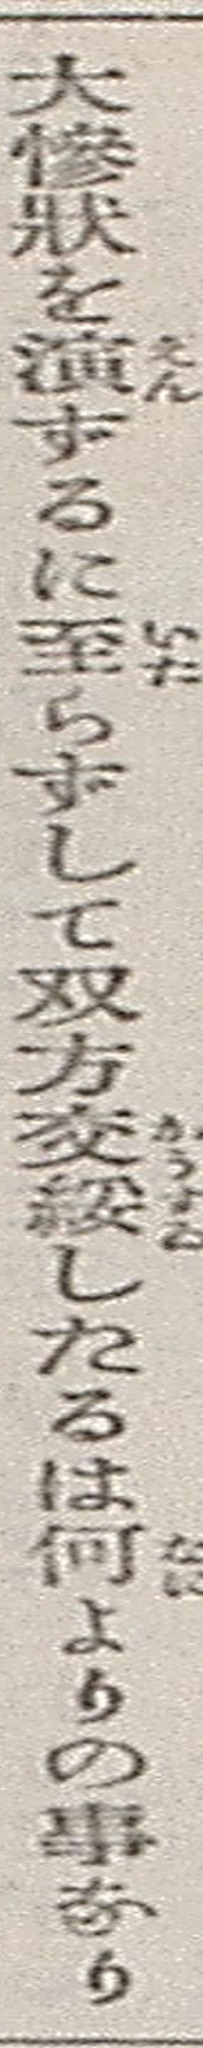大惨状を演ずるに至らずして双方交綏したるは何よりの事なり
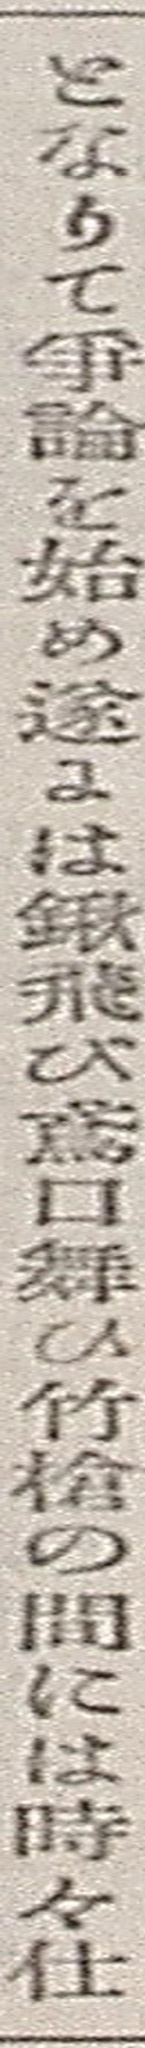となりて争論を始め遂には鍬飛び鳶口舞ひ竹槍の間には時々仕
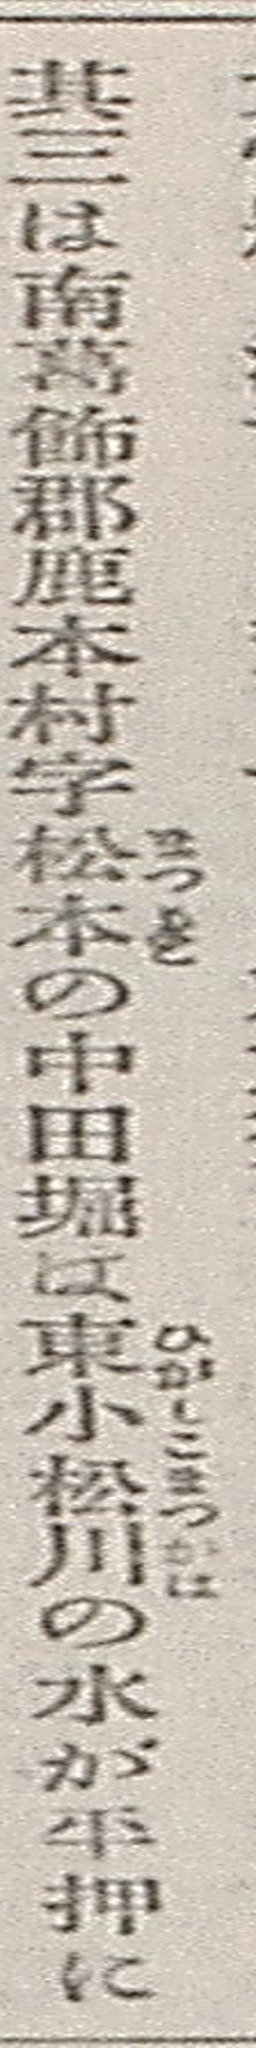其三は南葛飾郡鹿本村字松本の中田堀は東小松川の水が平押に
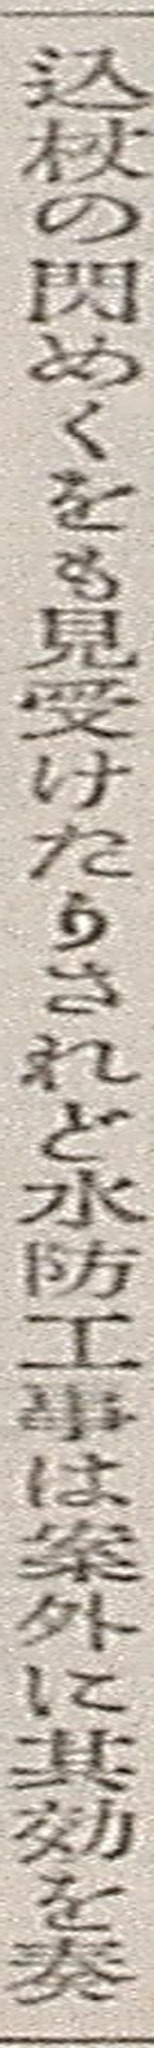込杖の閃めくをも見受けたりされど水防工事は案外に其効を奏
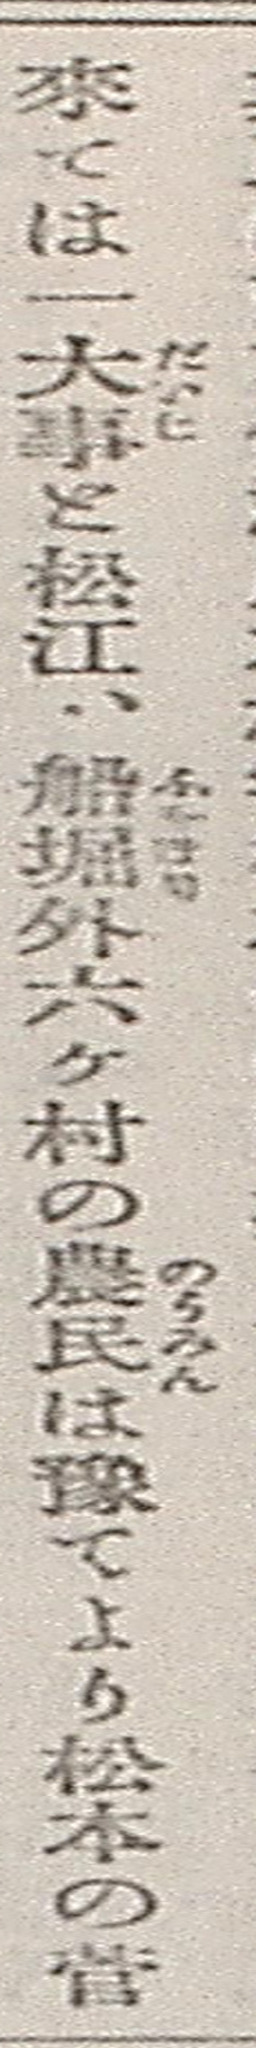来ては一大事と松江、船堀外六ケ村の農民は予てより松本の菅
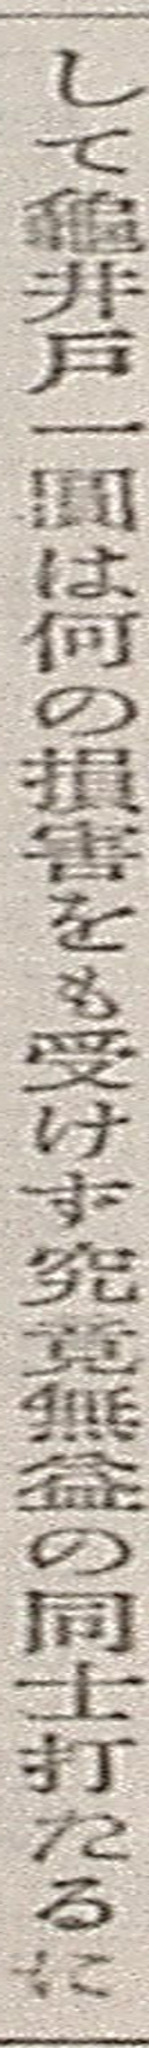して亀井戸一円は何の損害をも受けず究竟無益の同士打たるに
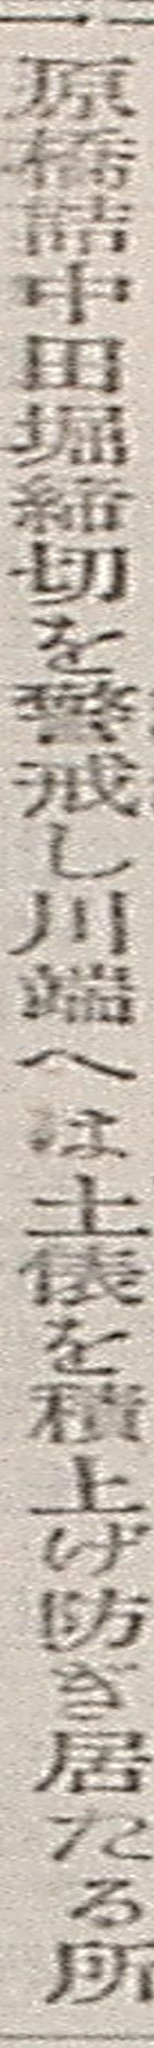原橋詰中田堀締切を警戒し川端へは土俵を積上げ防ぎ居たる所
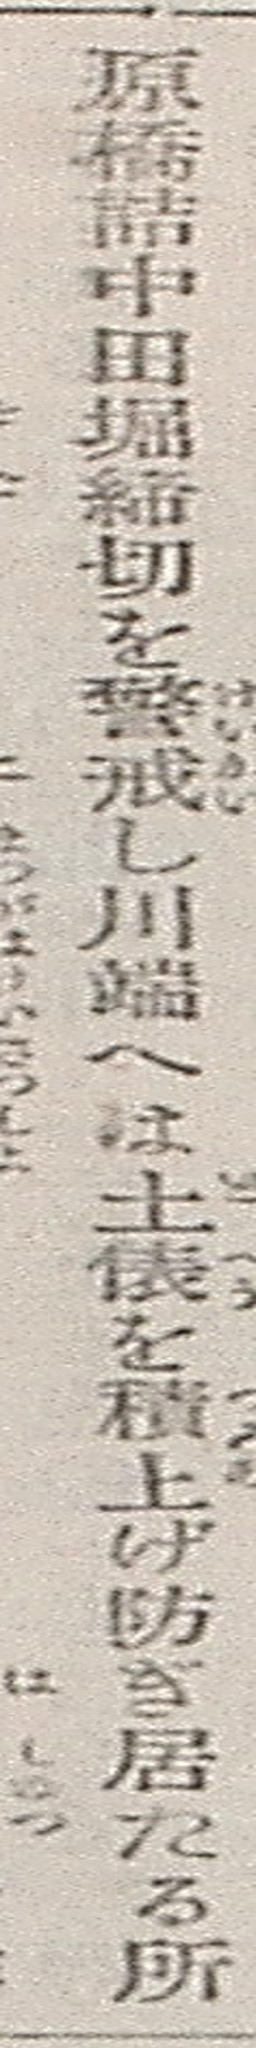原橋詰中田堀締切を警戒し川端へは土俵を積上げ防ぎ居たる所
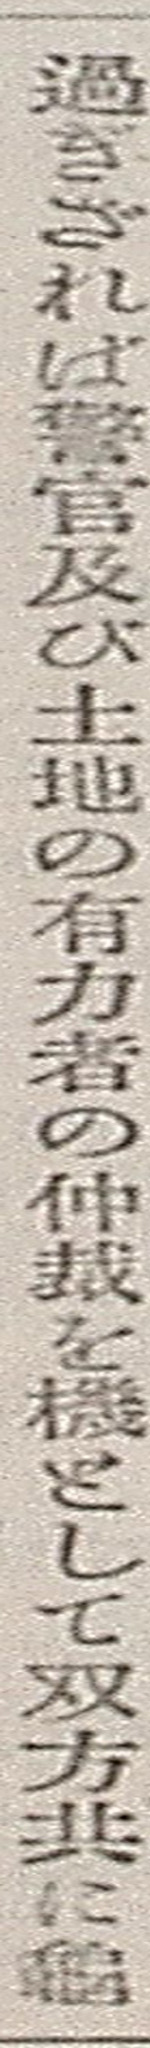過ぎざれば警官及び土地の有力者の仲裁を機として双方共に亀
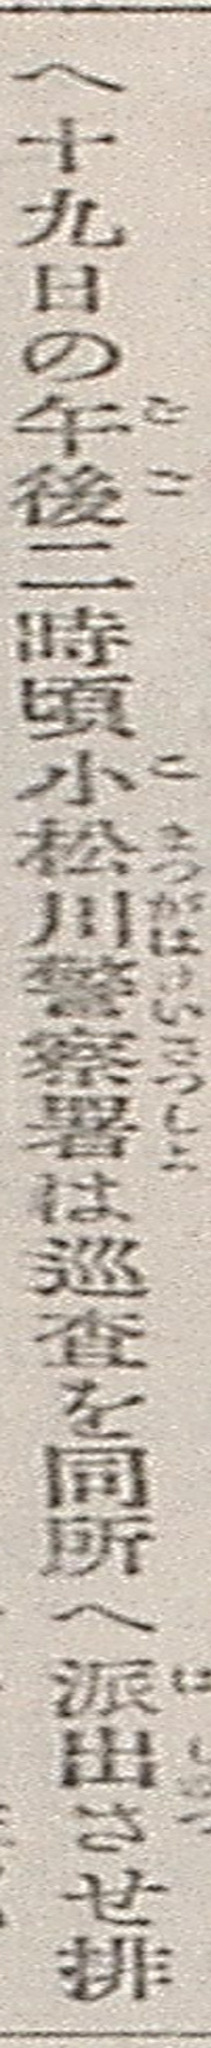へ十九日の午後二時頃小松川警察署は巡査を同所へ派出させ排
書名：風俗畫報臨時増刊第百二十四號　洪水地震被害録（上）
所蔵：東京大学地震研究所図書室 Earthquake Research Institute Library, The University of Tokyo, JAPAN
